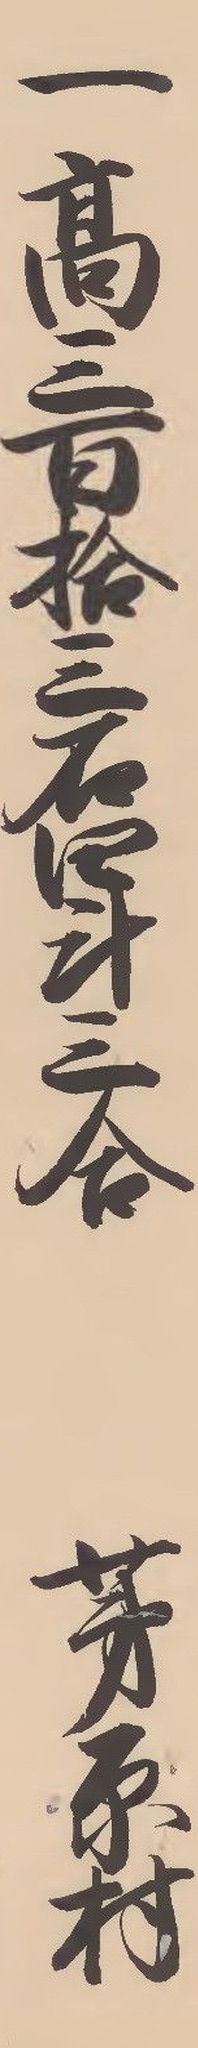一高三百拾三石四斗三合茅原村
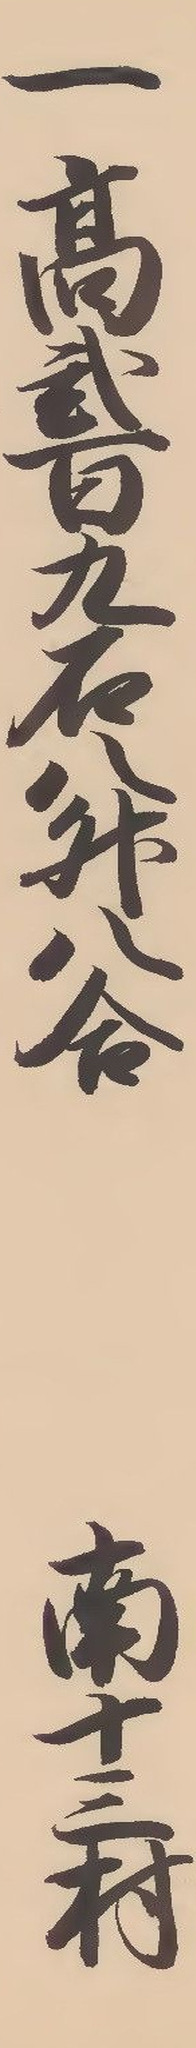一高弐百九石八升八合南十三村

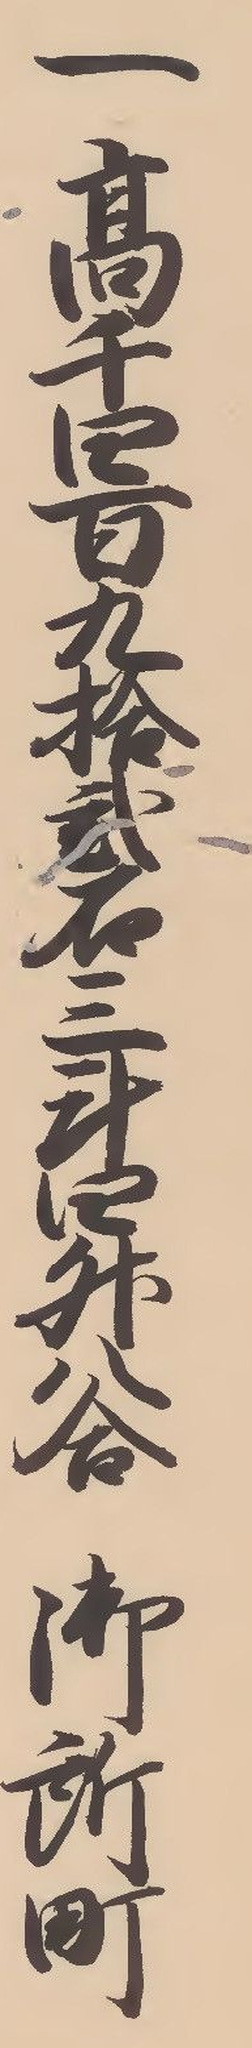一高千四百九拾弐石三斗四升八合御所町
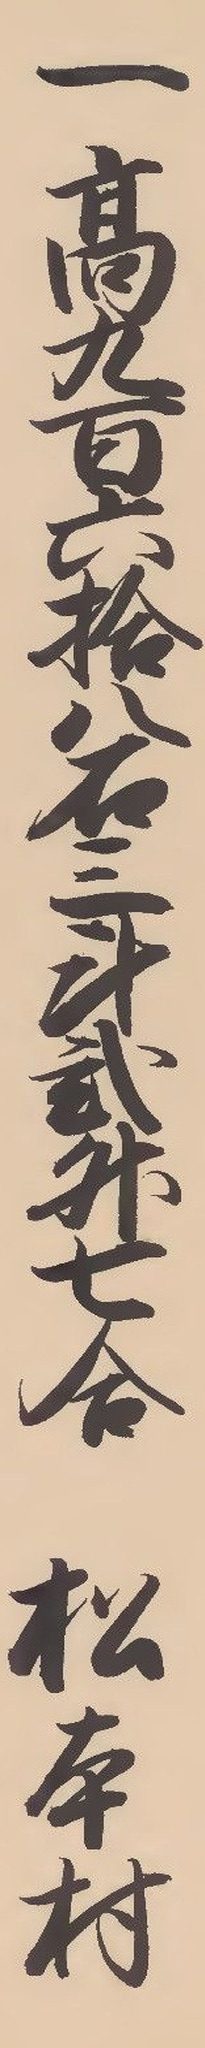一高九百六拾八石三斗弐升七合松本村
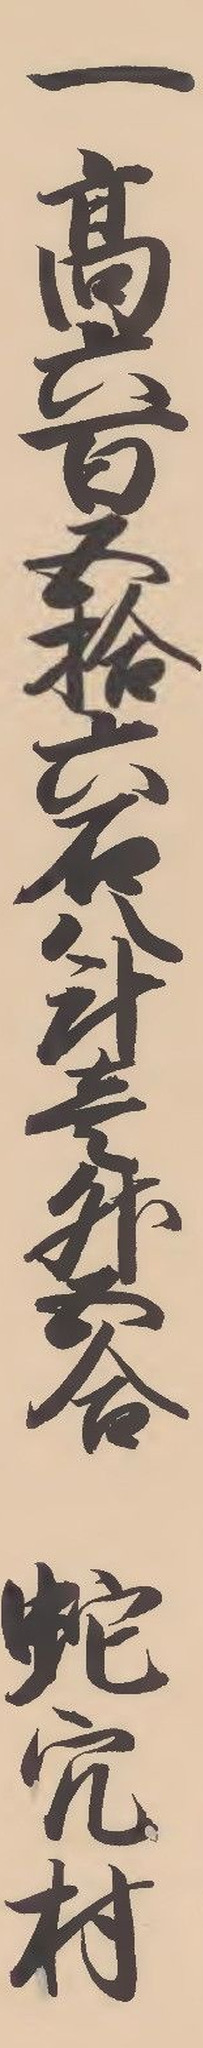一高六百五拾六石八斗壱升五合蛇穴村
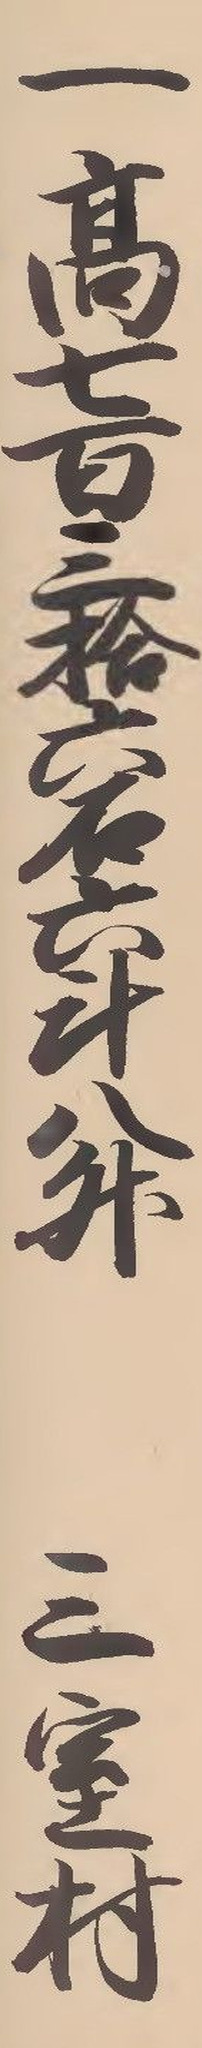一高七百三拾六石六斗八升三室村
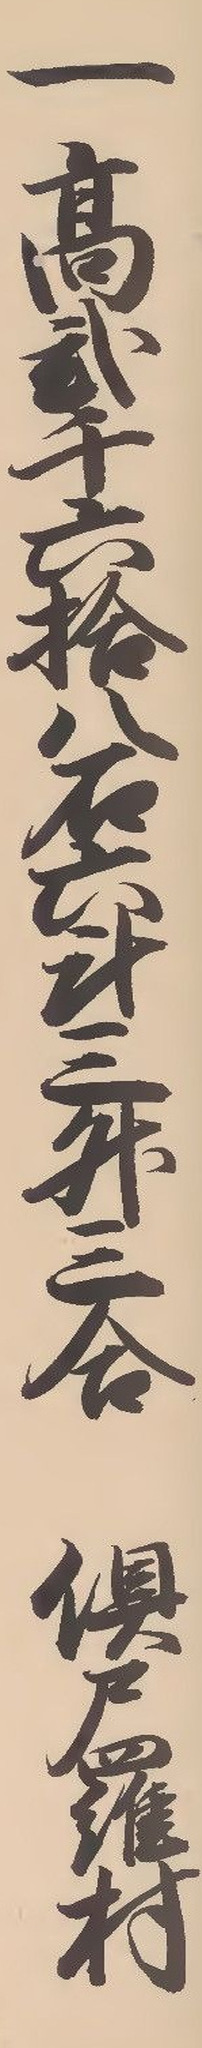一高弐千六拾八石六斗三升三合倶尸羅村
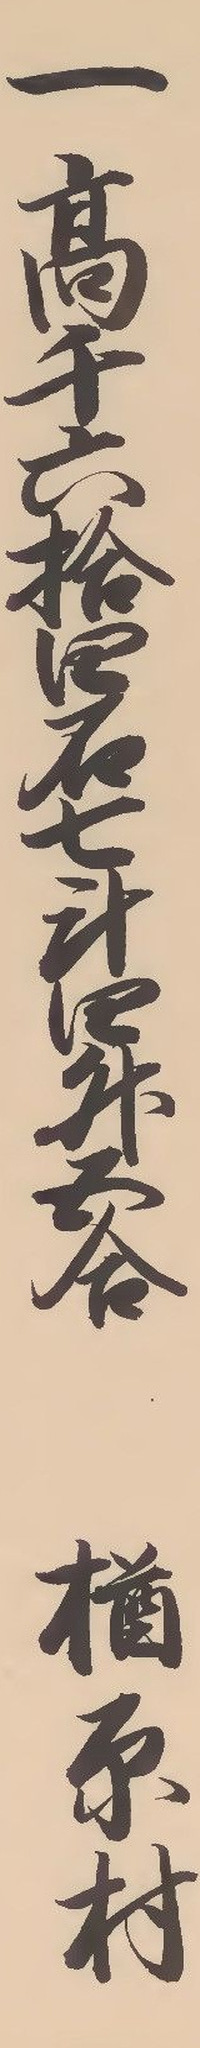一高千六拾四石七斗四升五合楢原村

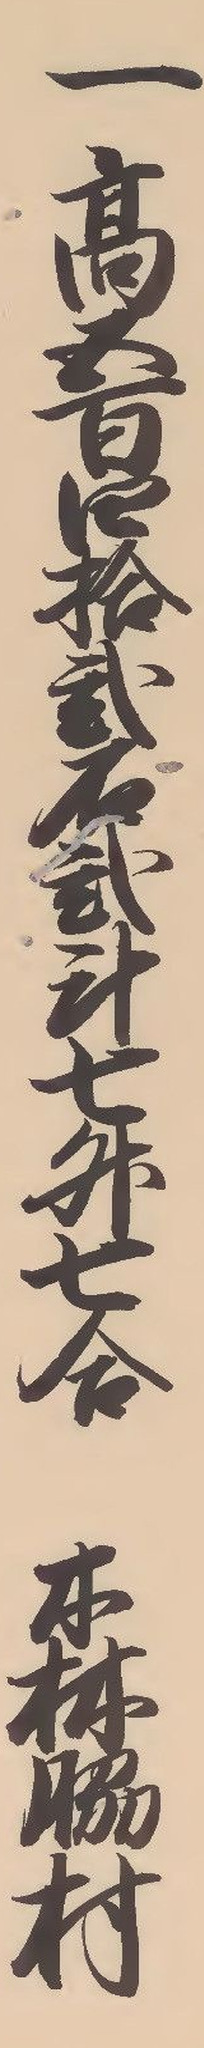一高五百四拾弐石弐斗七升七合森脇村
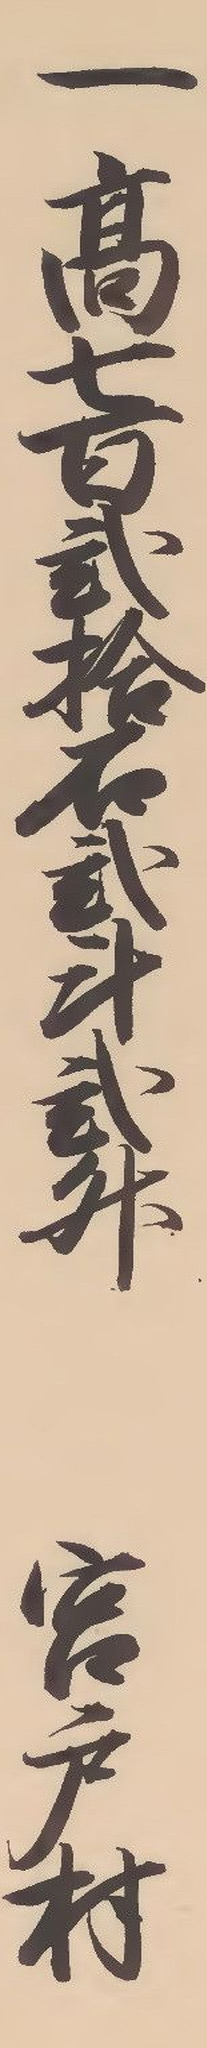一高七百弐拾石弐斗弐升宮戸村
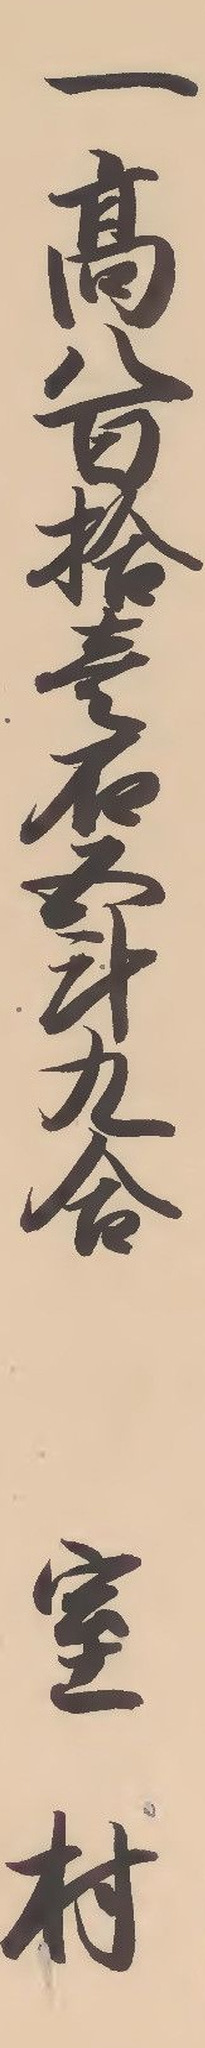一高八百拾壱石五斗九合室村
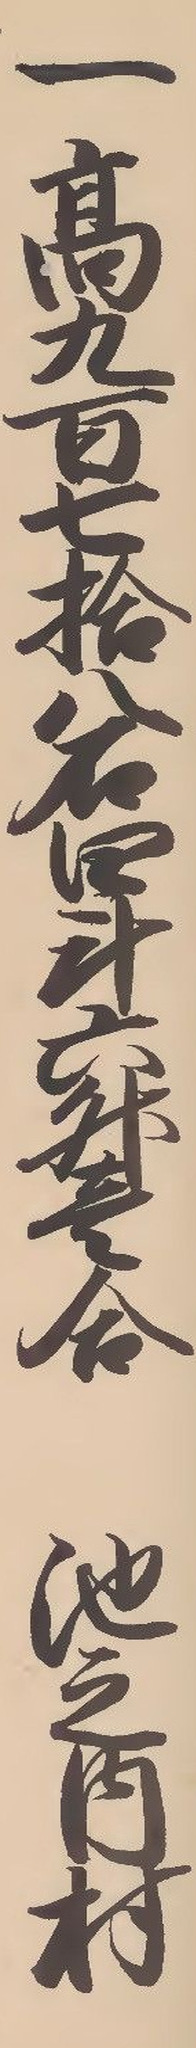一高九百七拾八石四斗六升壱合池之内村
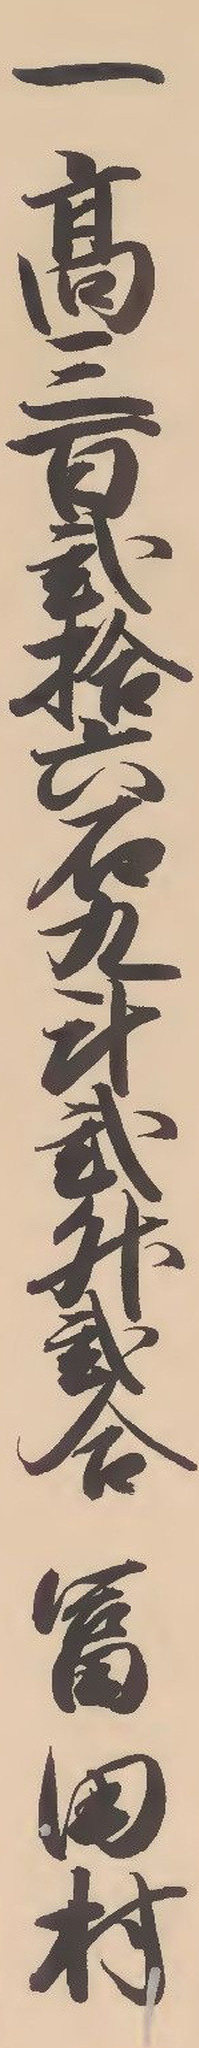一高三百弐拾六石九斗弐升弐合富田村
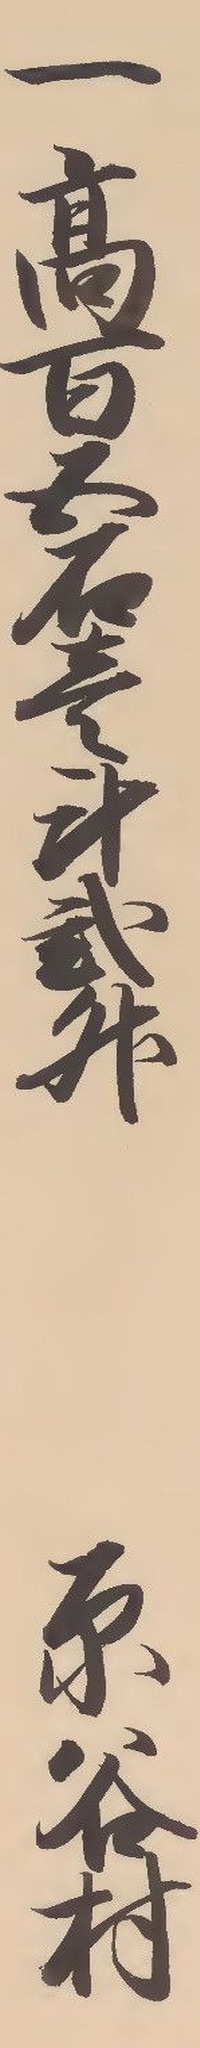一高百五石壱斗弐升原谷村
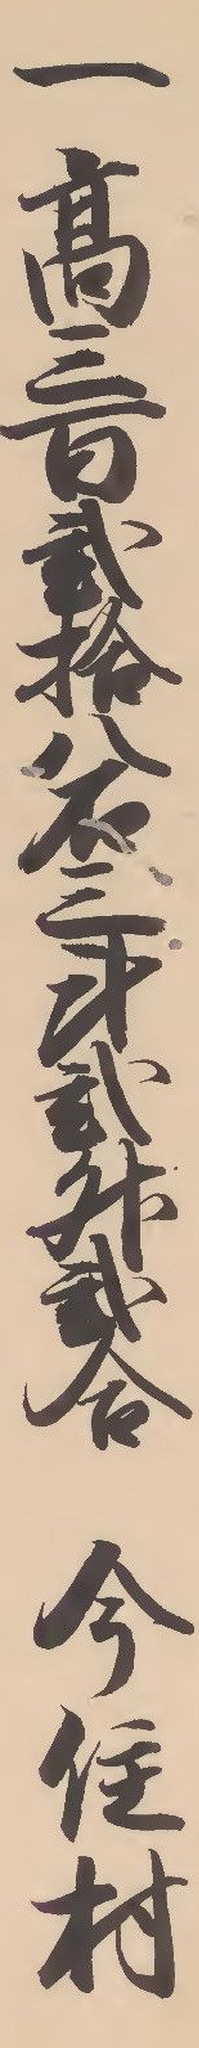一高三百弐拾八石三斗弐升弐合今住村

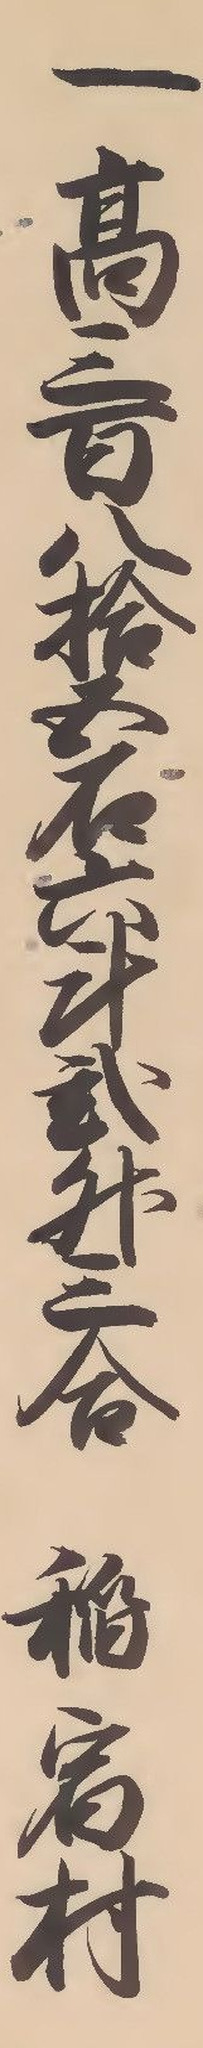一高三百八拾五石六斗弐升三合稲宿村
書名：大和国郷帳
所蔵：国立公文書館 National Archives of Japan
